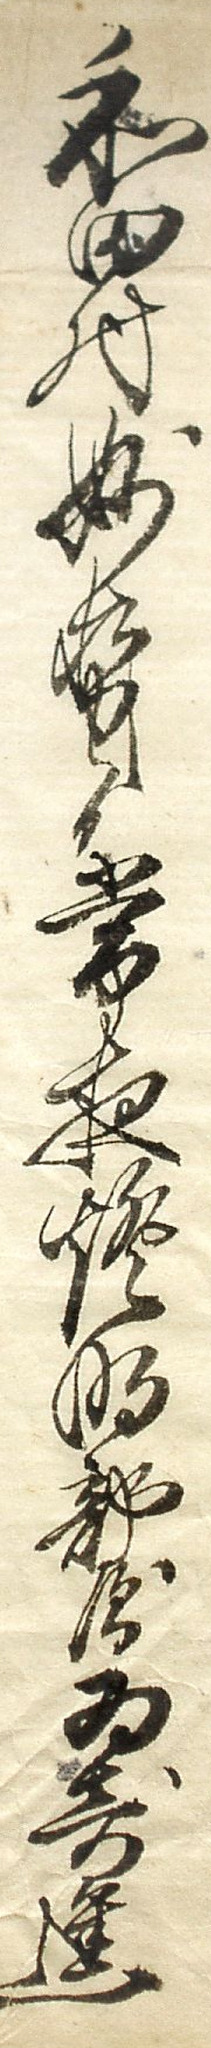和田村妙勢ゟ常夜燈明部屋為寄進
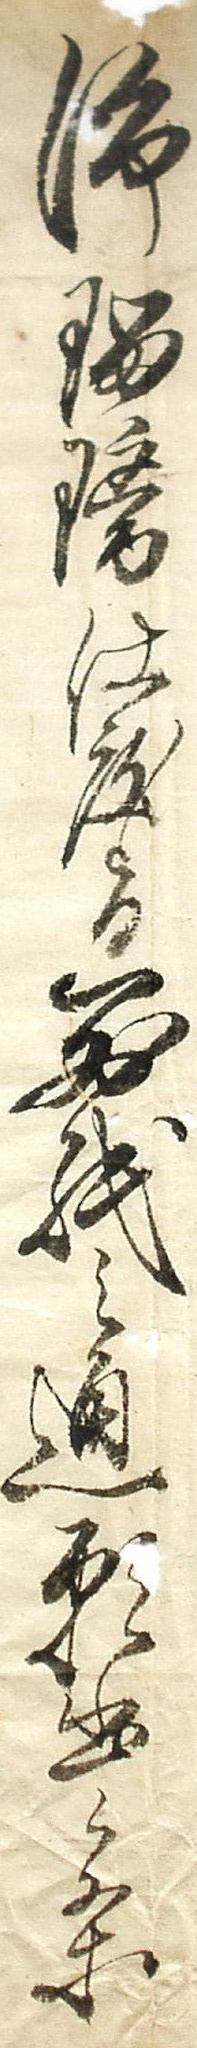浄瑠璃仕度旨別紙之通願出候条
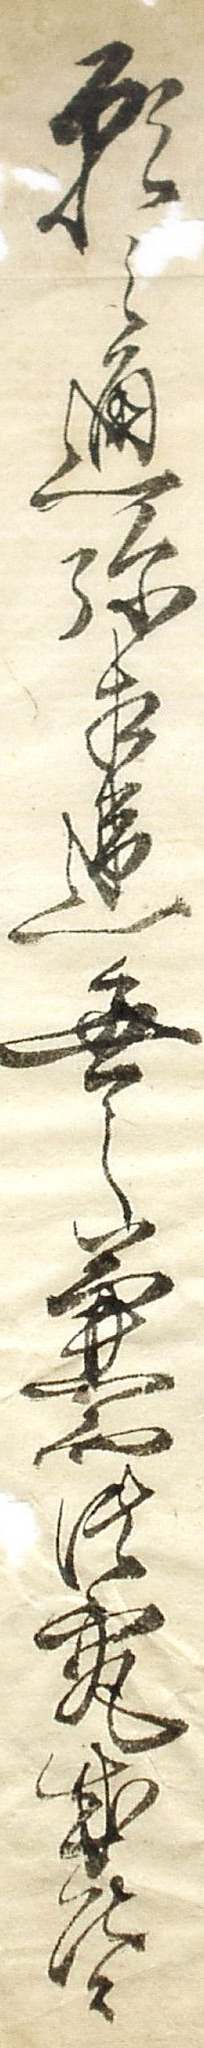願之通弥相違無之兼而御究成居候
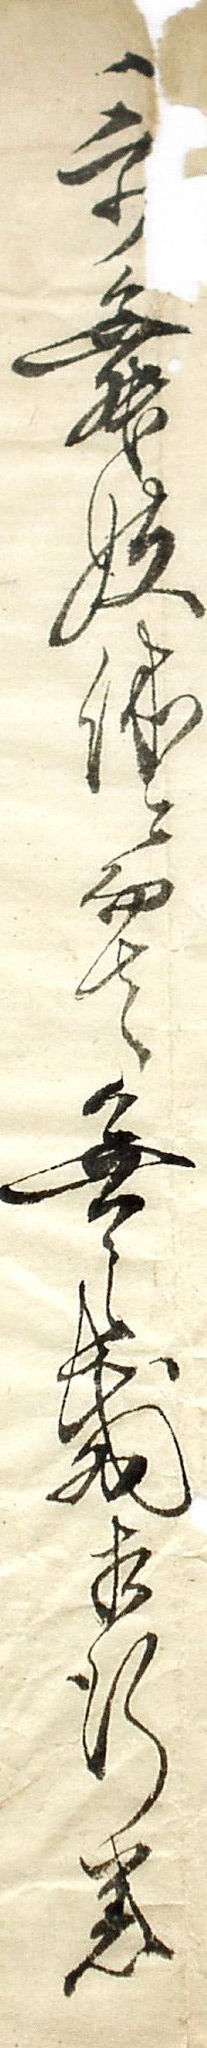歌舞妓体ニ而は無之哉相行着
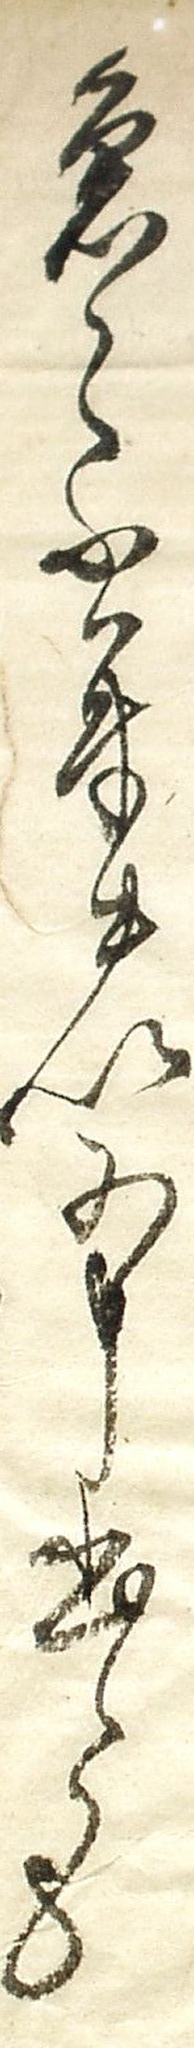急〻書付ヲ以可申出候以上
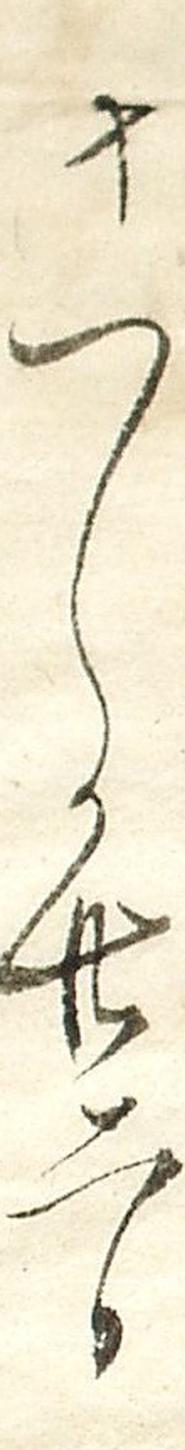十一月廿二日
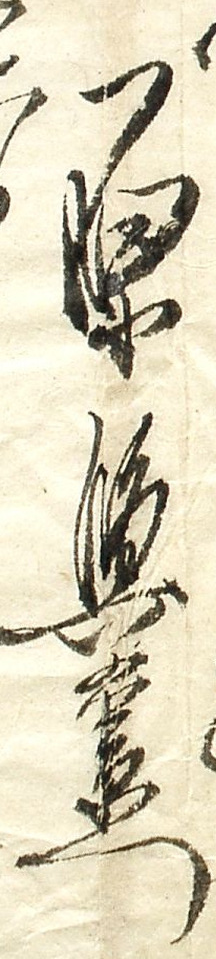原与右衛門
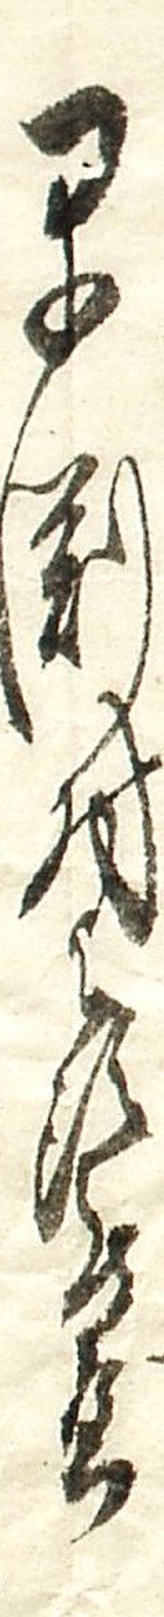早渕村与頭庄屋
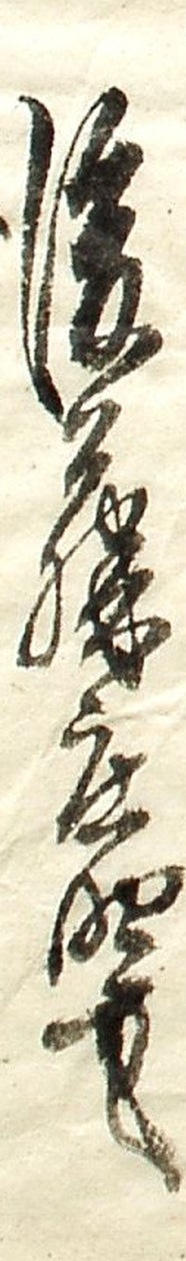後藤庄助方へ

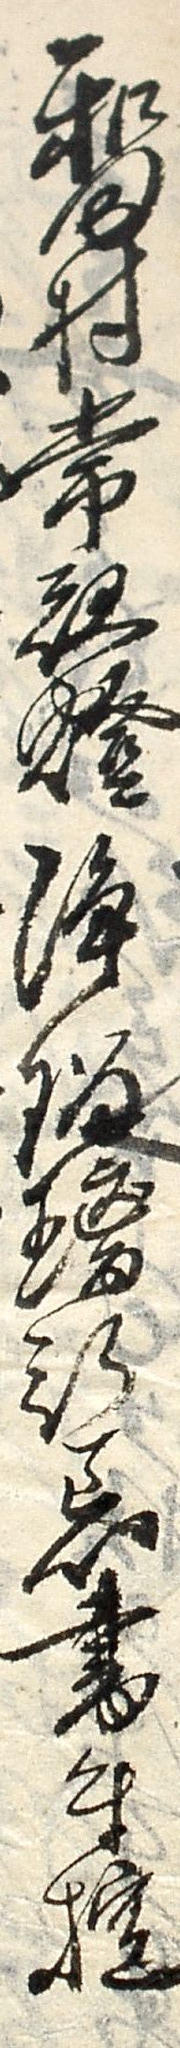和田村常夜燈浄瑠璃行着書付控
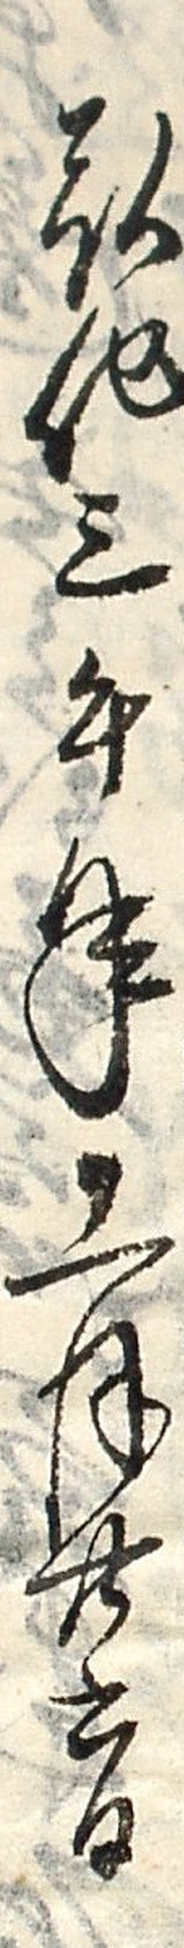弘化三午年十一月廿六日

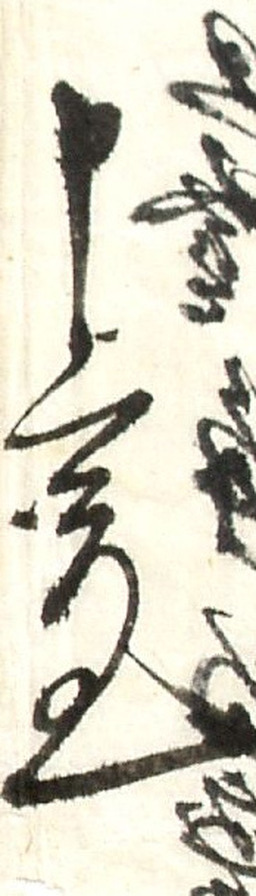申上覚
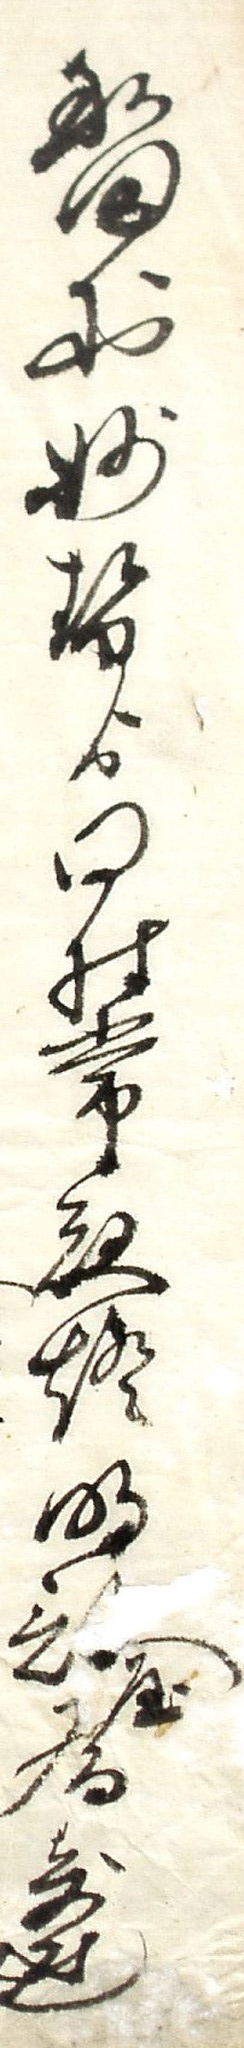和田村妙勢ゟ同村常夜燈明部屋為寄進
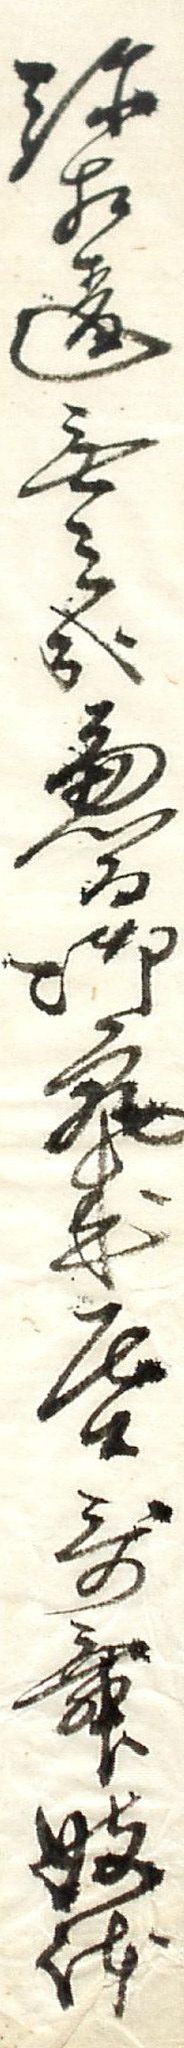弥相違無之哉兼而御究成居候哥舞妓体
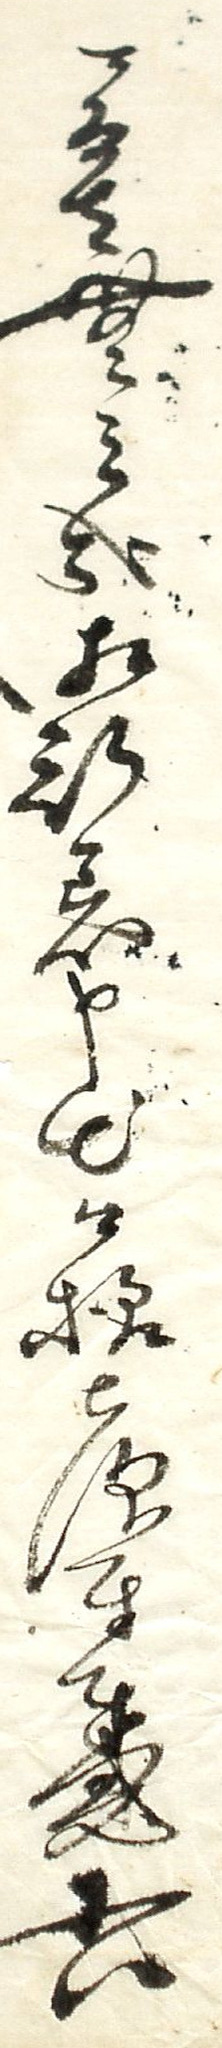ニ而者無之哉相行着申出候様被仰付奉畏右
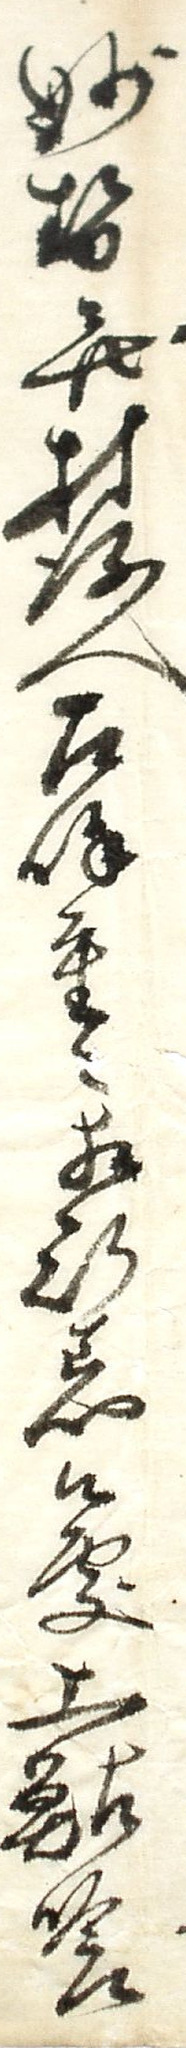妙勢幷村役人召呼重々相行着候所候上點喰
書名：和田村常夜燈寄進浄瑠璃行着書控他
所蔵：鳴門教育大学 Naruto University of Education
